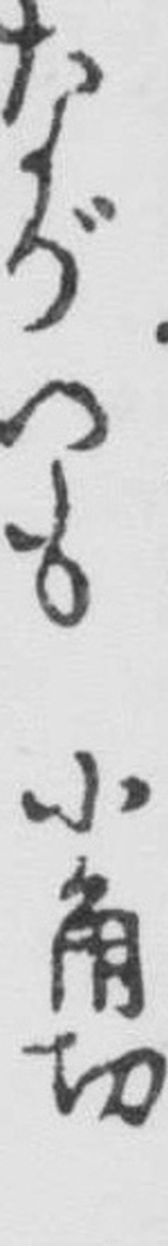ながいも小角切
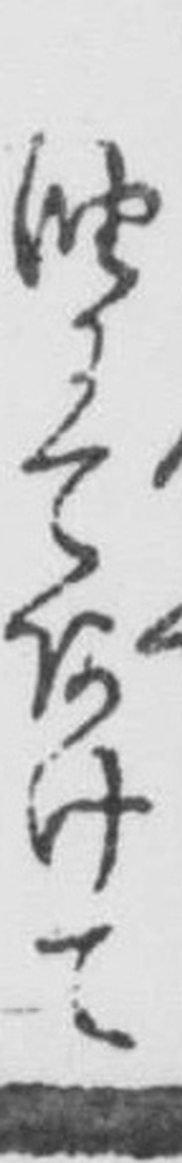油にてあけて
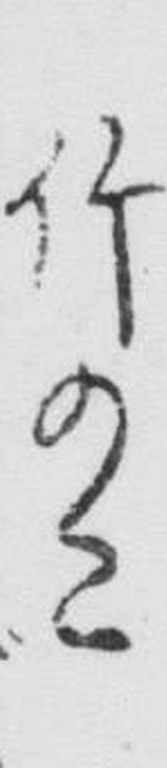竹のこ
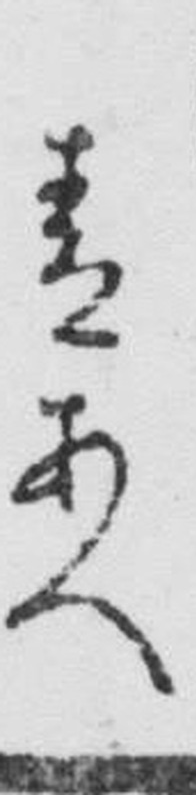青あへ
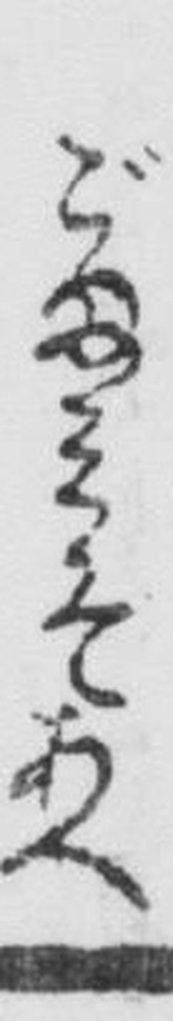ごまみそあへ
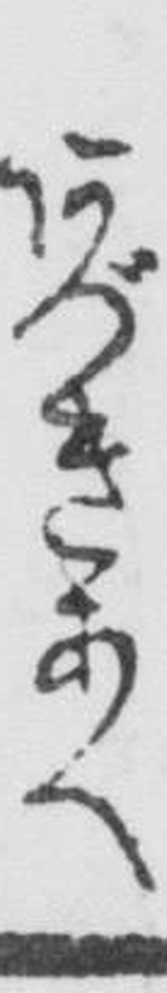あづきあへ
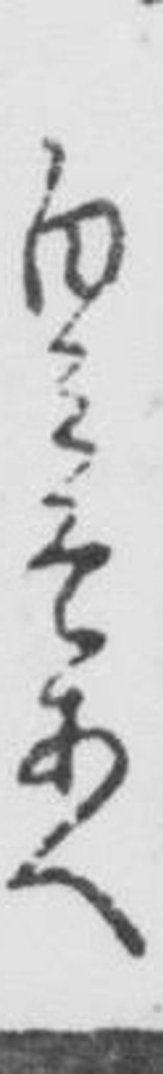白みそあへ
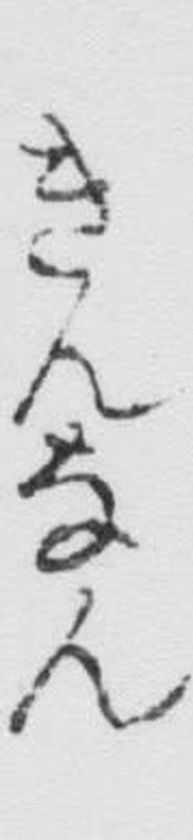きんなん
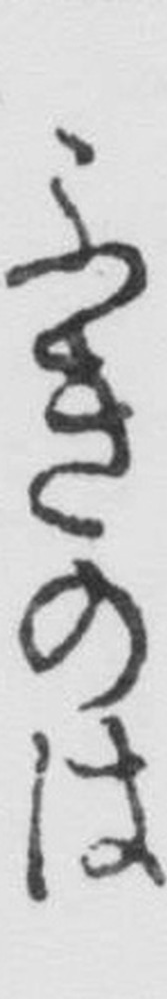ふきのは
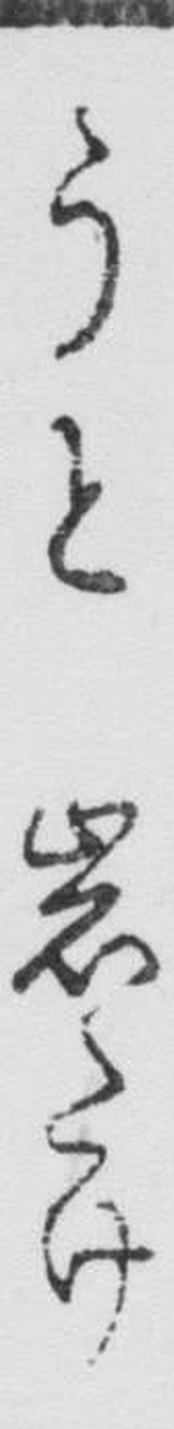うと岩たけ
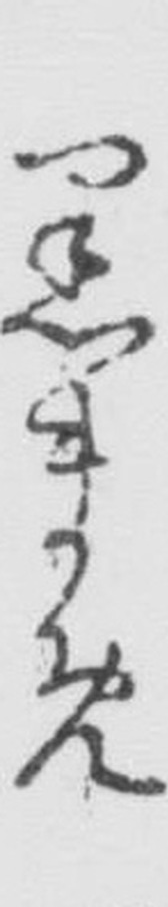黒まめ
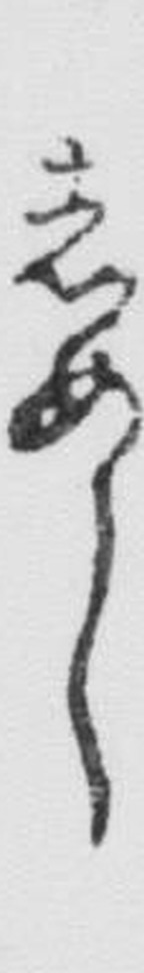しめし
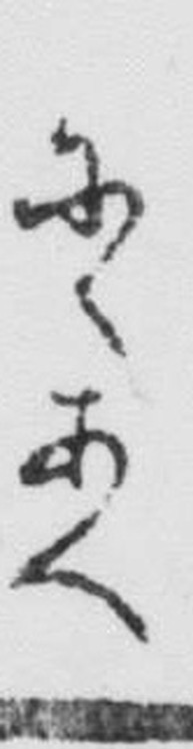にくあへ
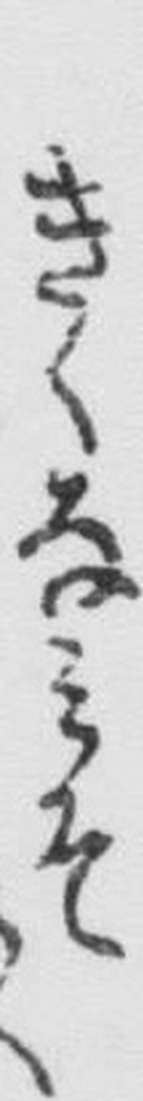きくなみそ
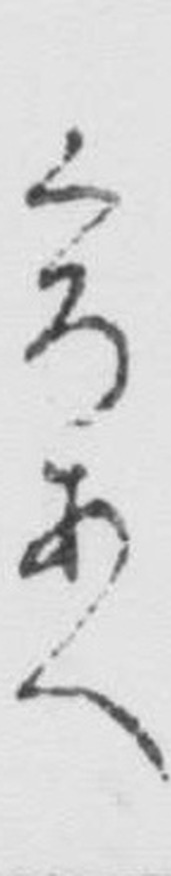くろあへ
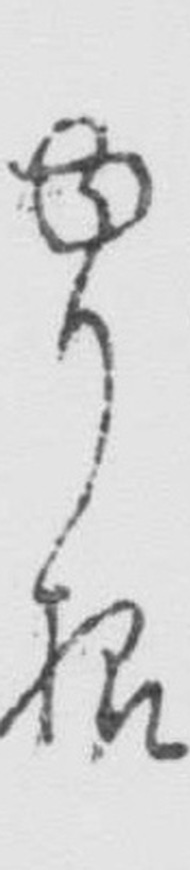ゆりね
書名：諸家通用/即席料理
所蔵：大阪府立大学学術情報センター 国文学研究資料館
